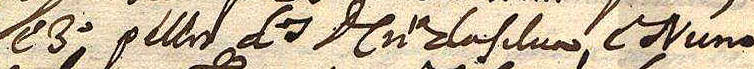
E 3o pellos dos D Cna da silua, E Nuno
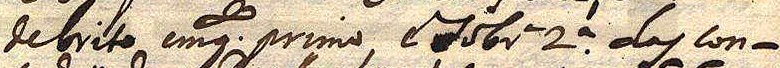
de brito emq.to primo, E sobra 2.a das con
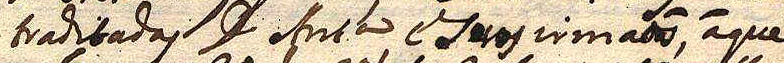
traditadas D Anta E seus irmaõs, a que
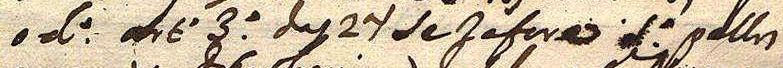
o do. arto 3.o das 2as se Refere d.o pellos
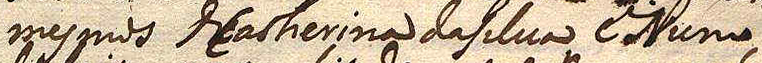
mesmos D Catherina da silua E Nuno
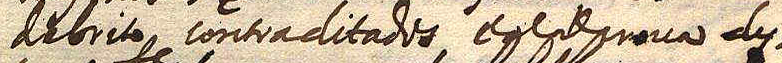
de brito contraditados, e q̄ p̄ proua des
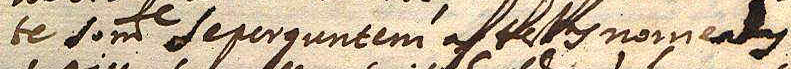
te somte se perguntem as testas nomeadas
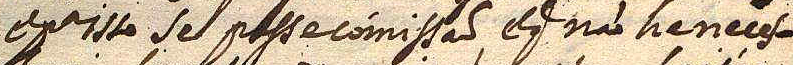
E pa isso se passe comissaõ E q̄ naõ he neces
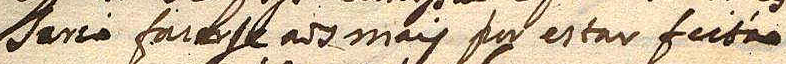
sario fazerse aos mais por estar feita
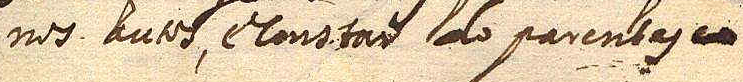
nos autos, E constaõ do parentesco
